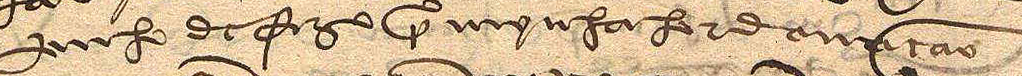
tenho defezo p̄o mynha hordenação
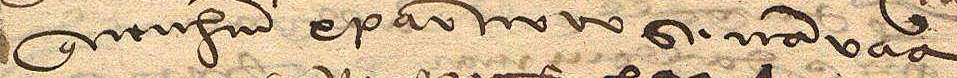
q̄ nenhū xpão novo se nā vaa
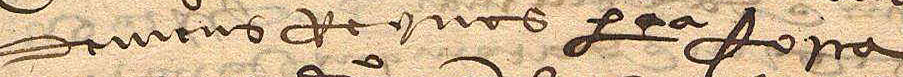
de meus Rejnos p̄a forra
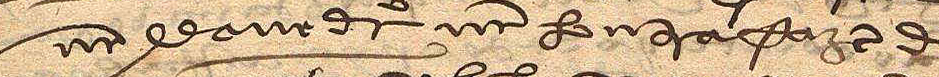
nē lleue dro nē houtra fazēda
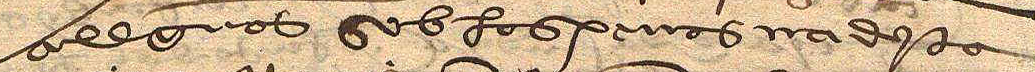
allgūas sob has penas na dyta
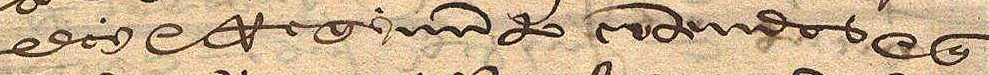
lley e Regymēto c̄oteudas e q̄
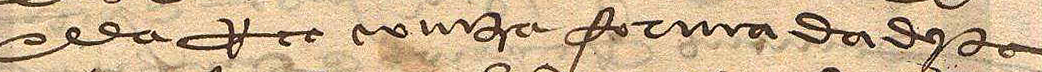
ella Ree comtra forma da dyta
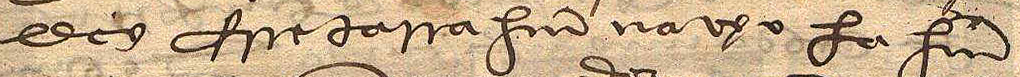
lley frretarra hū navyo ha hū
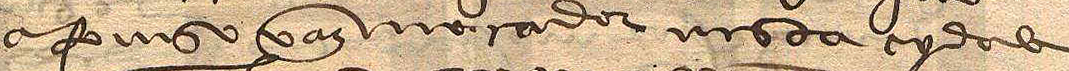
afomso v̄az morador nesta cydade
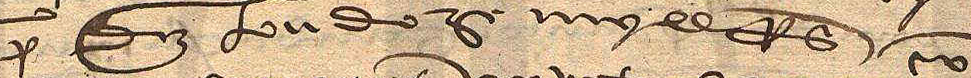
p̄o dez hou doze myll R̄s c̄o
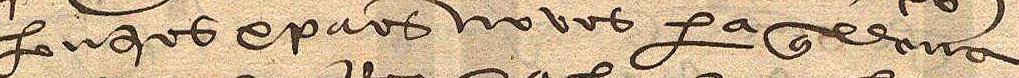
houtros xpaõs novos ꝑa q̄ lleua
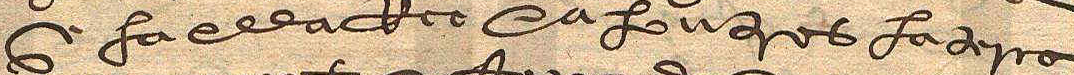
se ha ella Ree e a houtros ha terra
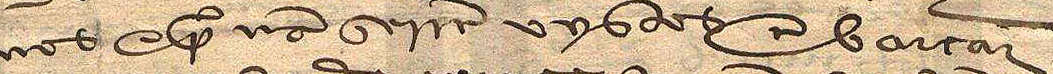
nos e p̄o nā serrē vystos ēbarcar
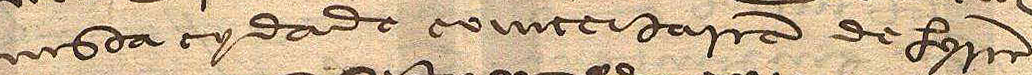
nesta cydade comcertarrā de hyrrē
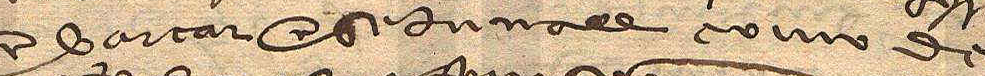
ēbarcar ē setuuall como de
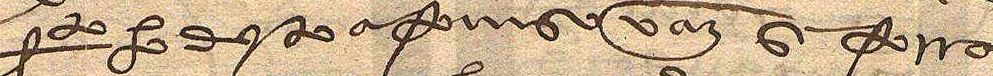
fto ho dyto afomso v̄az se forra
